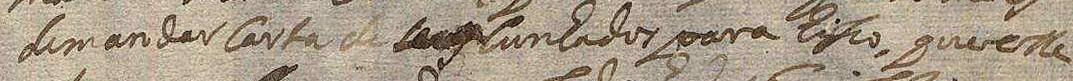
de mandar Carta de seus Cunhados para hisso, que elle
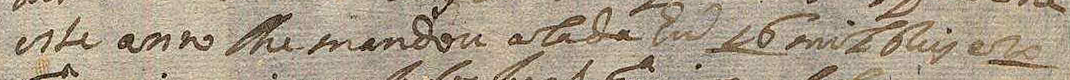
este anno lhe mandou a cada hu 16 mil Reis e 20
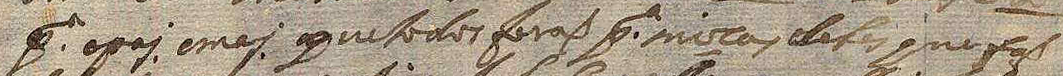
p.a o paj, e maj, o que todos foraõ p.a miças deles que saõ
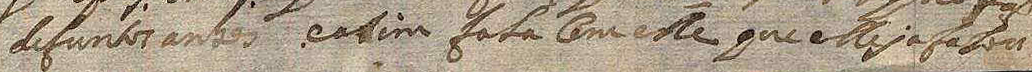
defuntos anbos, e asim fala com elle que elle ja falou
